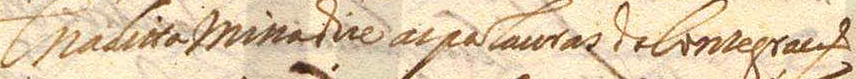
E na ditta missa diçe as palauras da Consegraçaõ
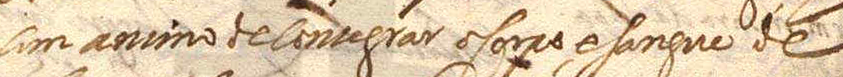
com animo de consegrar o Corpo, e sangue de
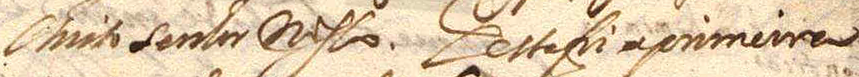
Christo senhor nosso. E esta foi a primeira
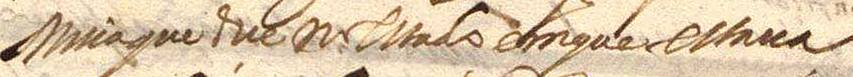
Missa que diçe no estado em que estaua,
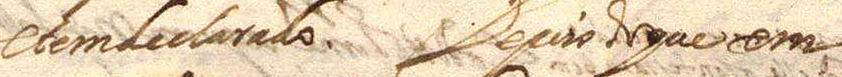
e tem declarado. Depois do que em
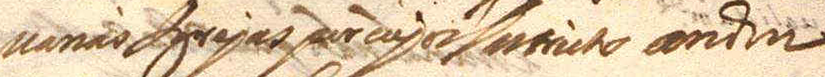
uarias Igrejas por cujos Destrictos andou
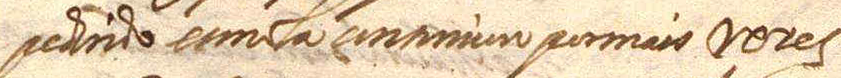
pedindo esmola continuou por mais vezes
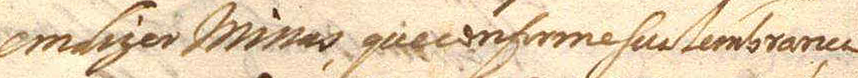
em dizer missas, que conforme sua Lembrança
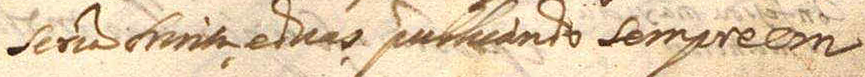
serão trinta, e duas, publicando sempre em
